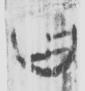曰
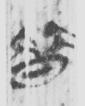昔
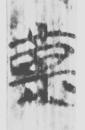黃
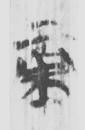帝
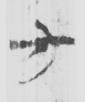方
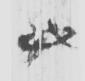四
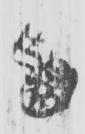面
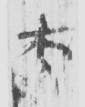夫
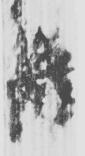幾
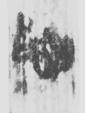面
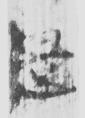是
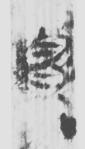胃
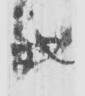四
